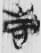青
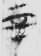辛
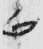㠯（以）
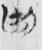○（廷）
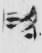阩
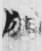門
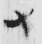又
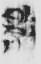敗
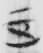正
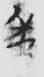秀
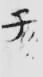孫
